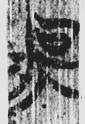昃（側）
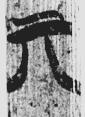亓（其）
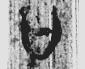口
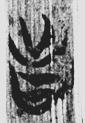舌
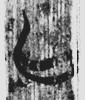㠯（以）
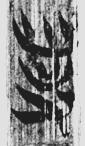○（變）
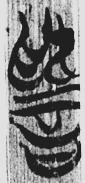譌（化）
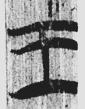王
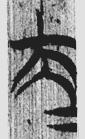夫
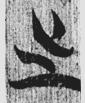之
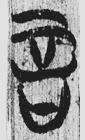言
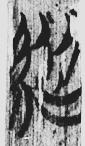縱
